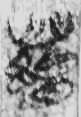○（猬）
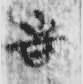告
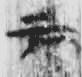下
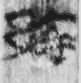○（蔡）
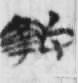執
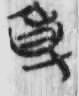事
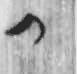人
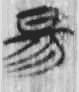昜（陽）
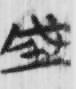城
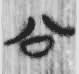公
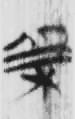样
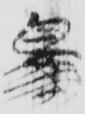睪
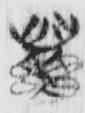猬
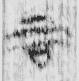言
